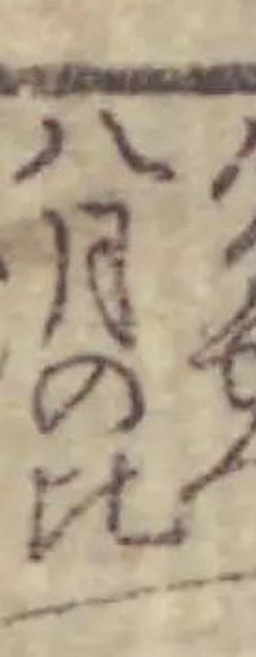八月の頃
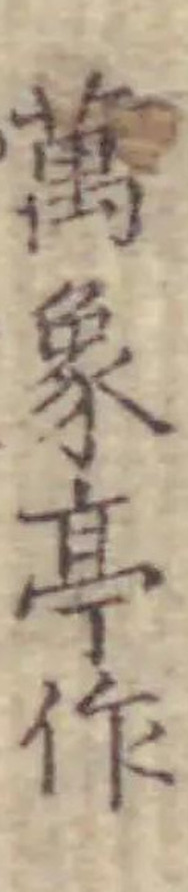萬象亭作
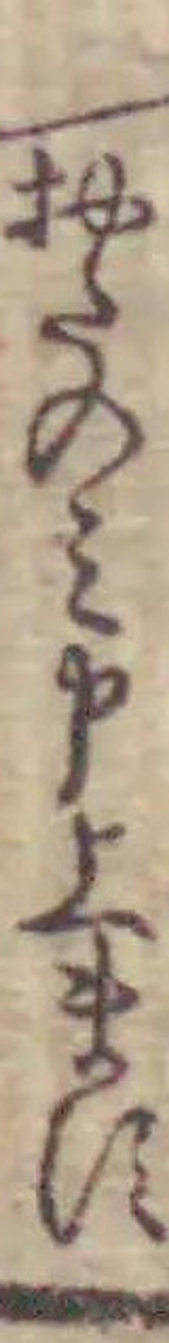おたのみ申上ます
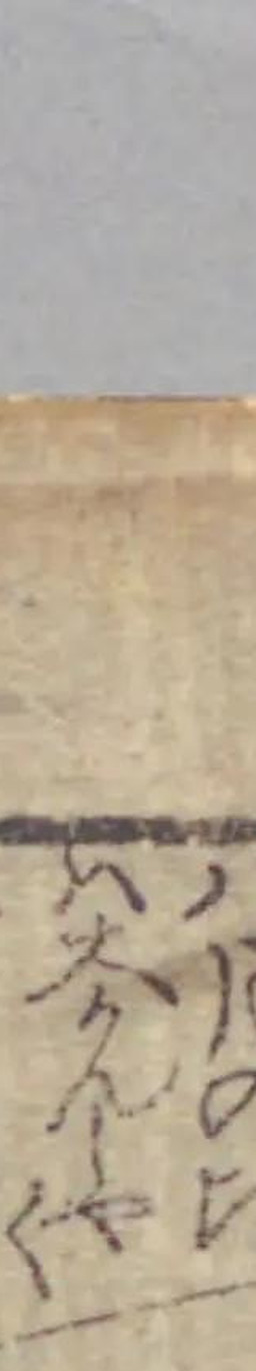は大かんしやく
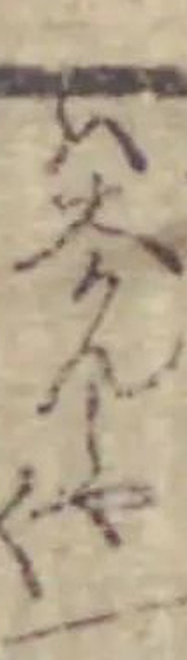は大かんしやく
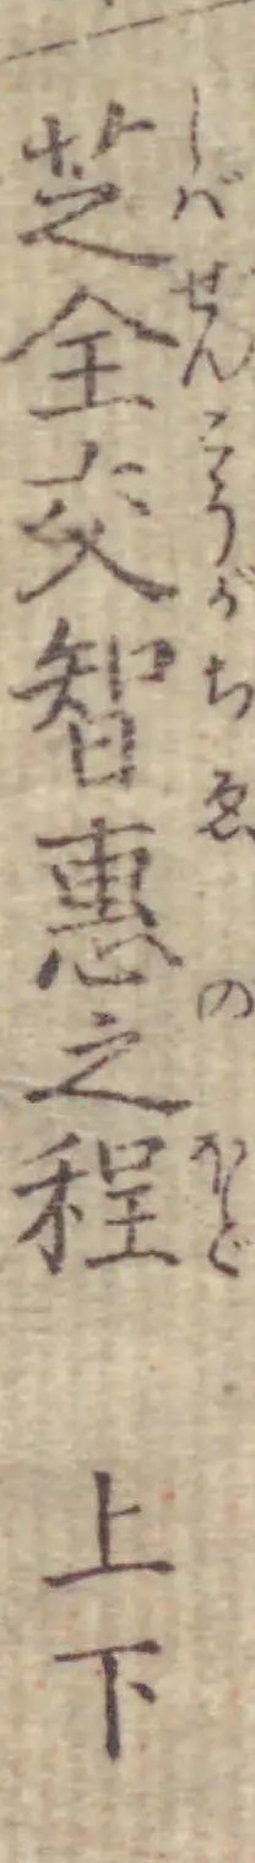芝全交智恵之程上下
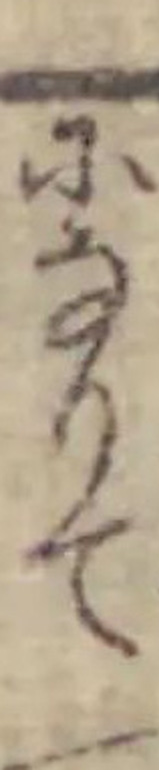になりて
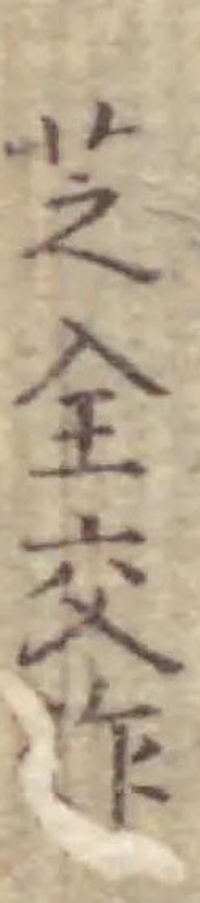芝全交作
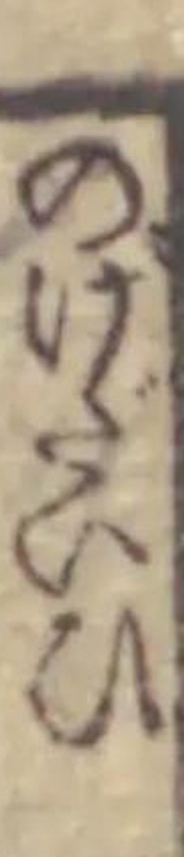のげだいひ
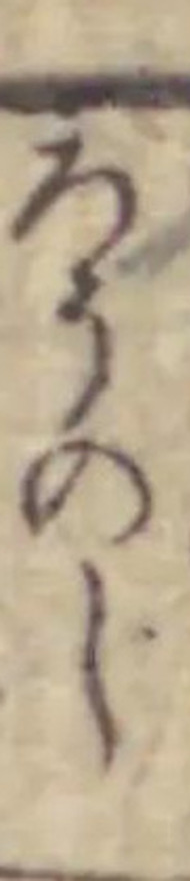ろうのじ
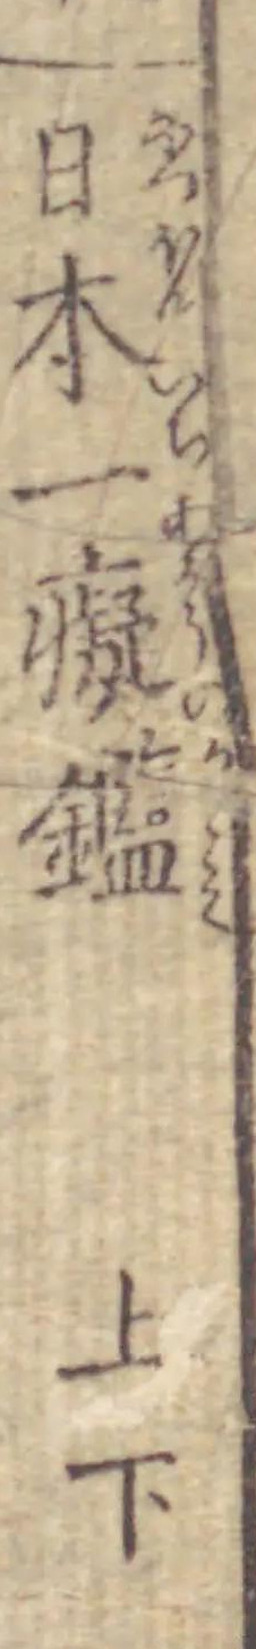日本一痴鑑上下
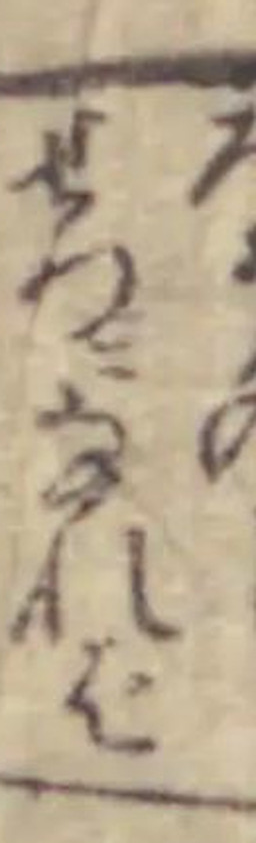せつになれば
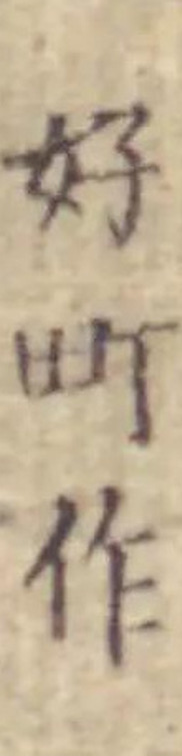好町作
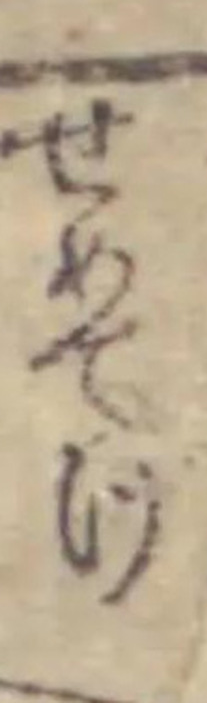せめてげ
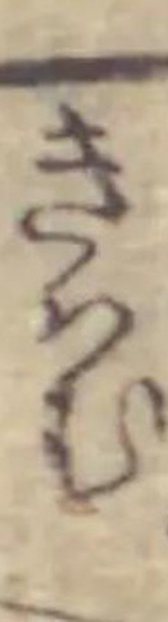きはむ
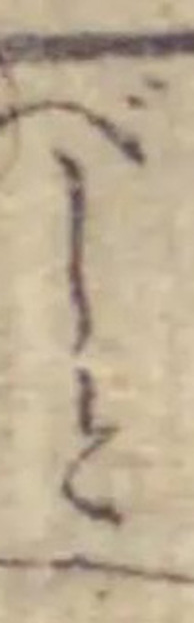べしと
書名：亀山人家妖 3巻
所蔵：国立国会図書館 National Diet Library, JAPAN
